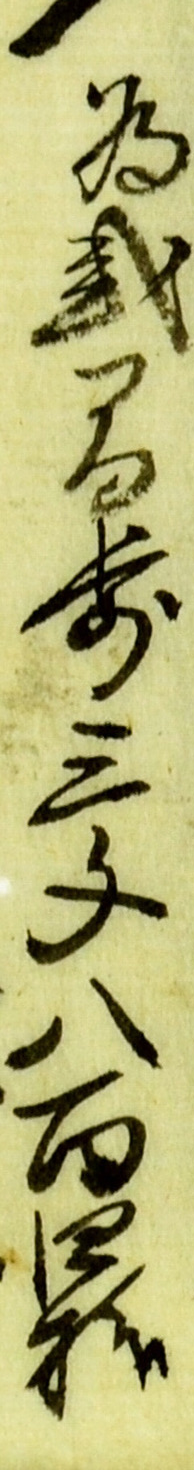為弐間歩三千八百四拾
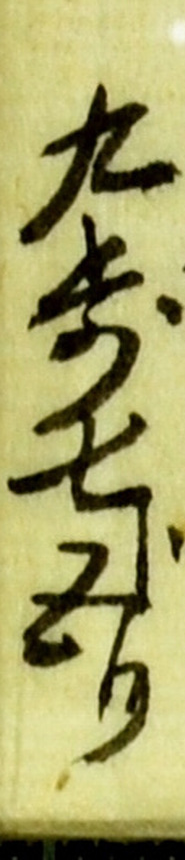九歩七分五厘
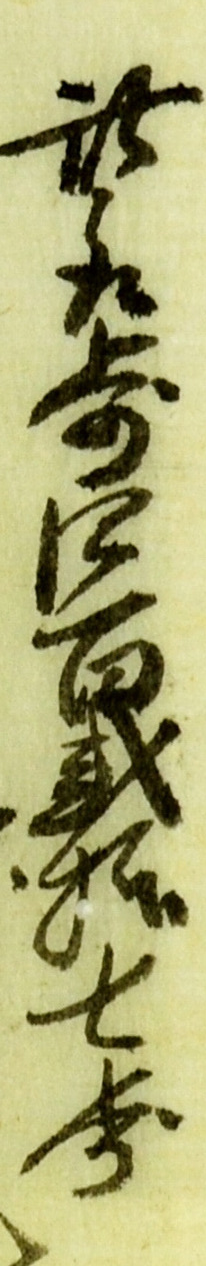此取歩四百弐拾七歩
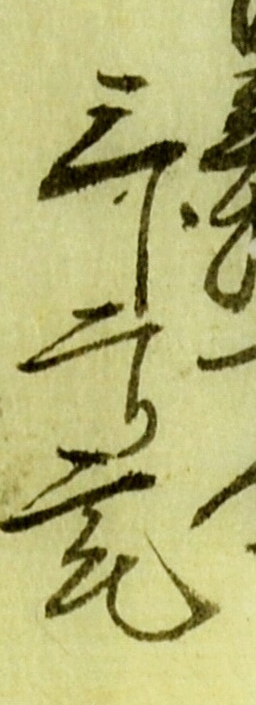三分二厘二毛

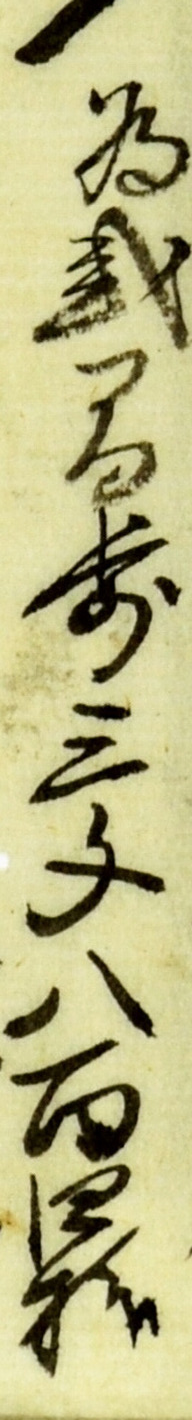為弐間歩三千八百四拾
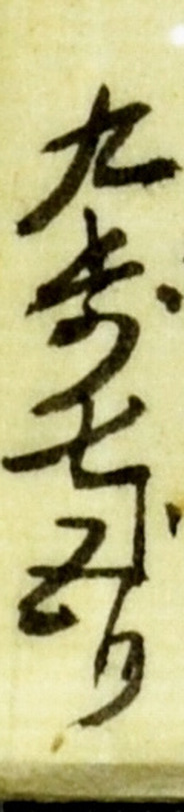九歩七分五厘
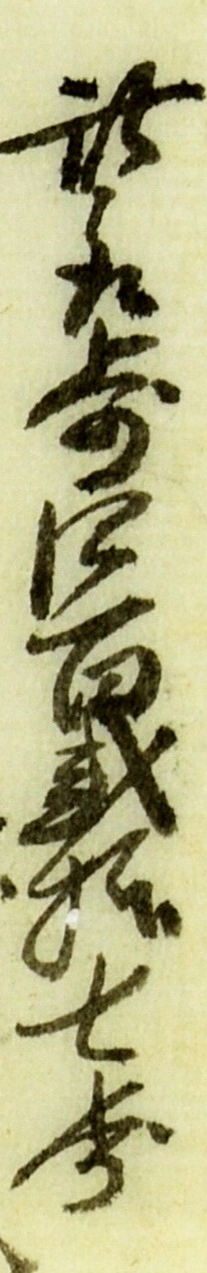此取歩四百弐拾七歩
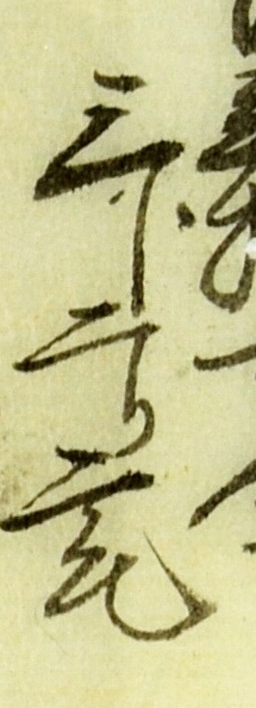三分二厘二毛
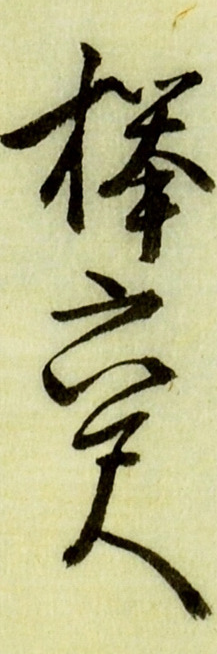欅六尺
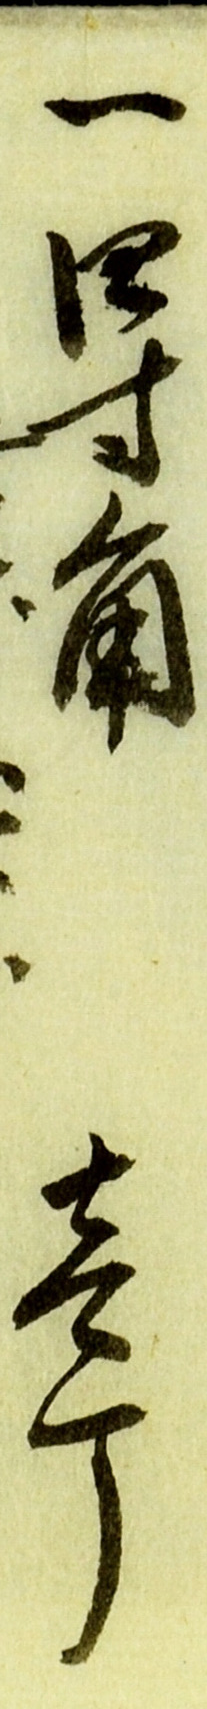一四寸角壱丁
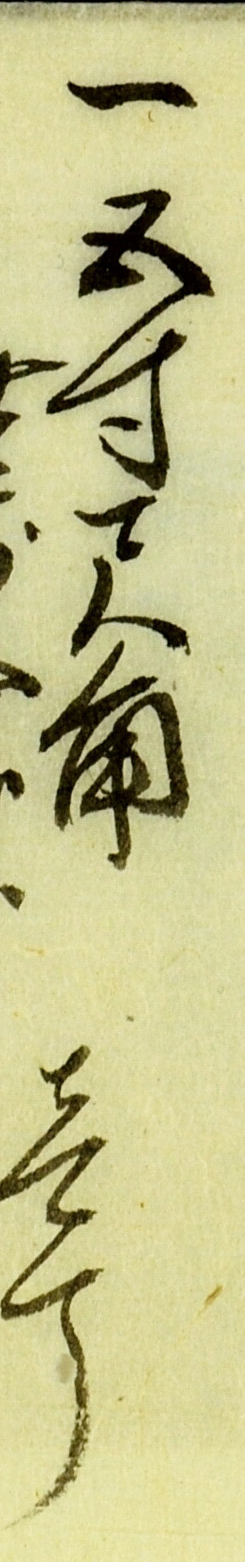一五寸尺角壱丁
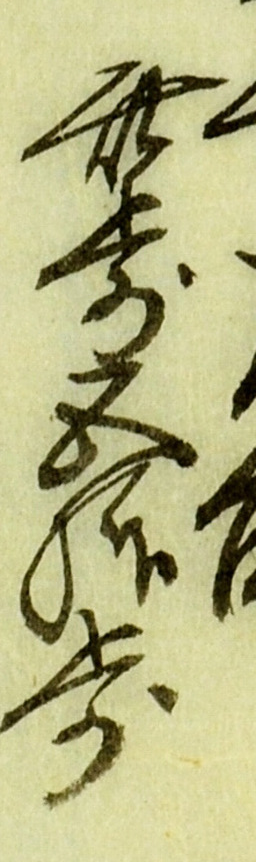此歩五拾歩
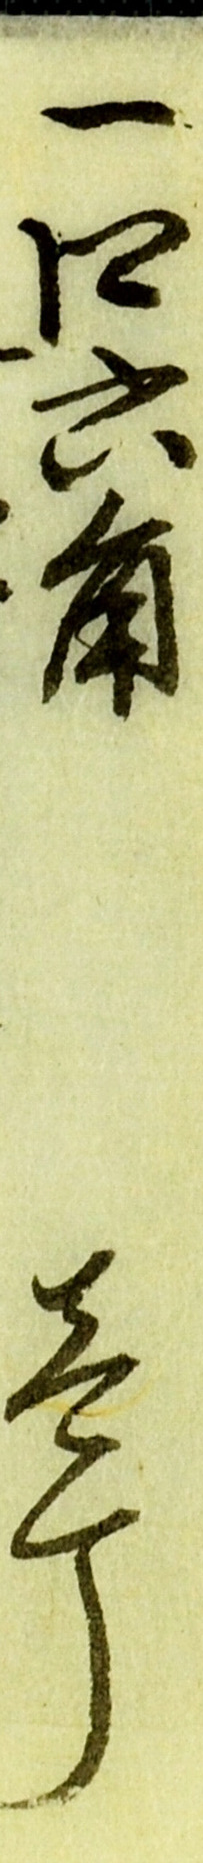一四六角壱丁
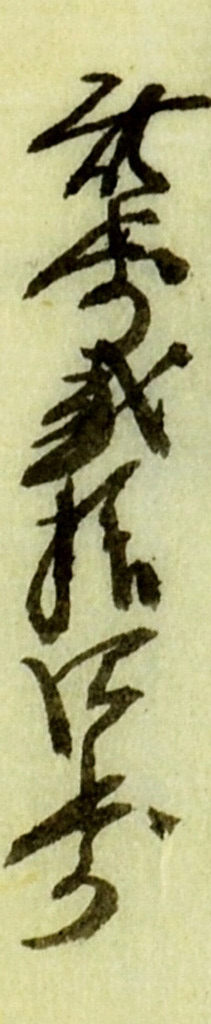此歩弐拾四歩
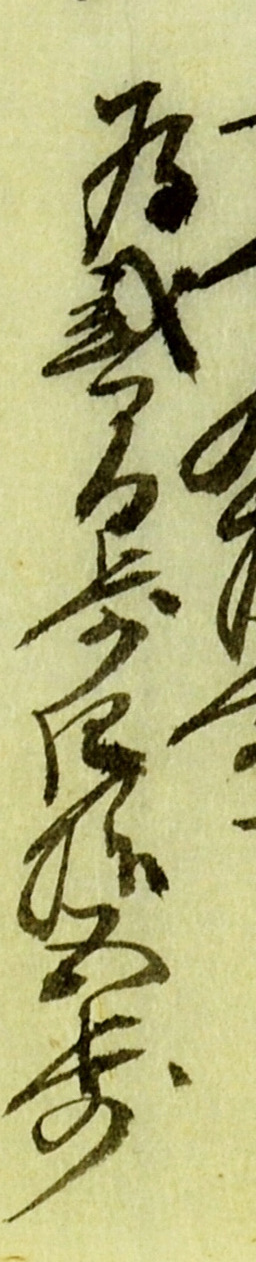為弐間歩四拾五歩
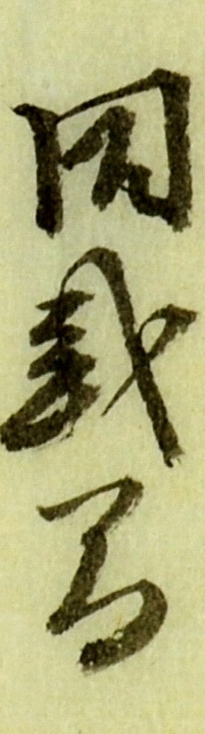同弐間
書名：材木川下ケ分一上納帳
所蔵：伊那市立高遠町図書館・合同会社AMANE
